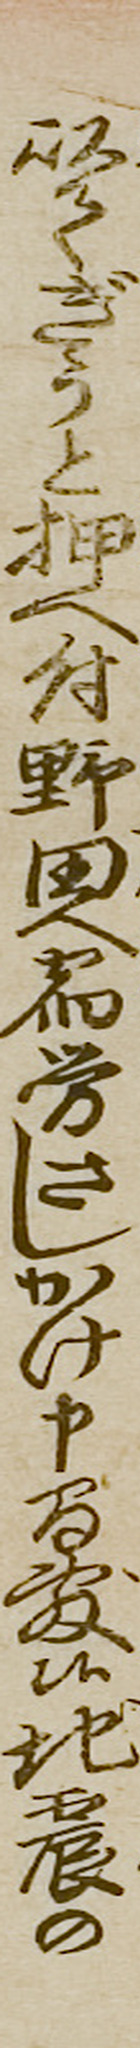以てぎうと押へ付野田へ宿労さしかけ申間敷候地震の
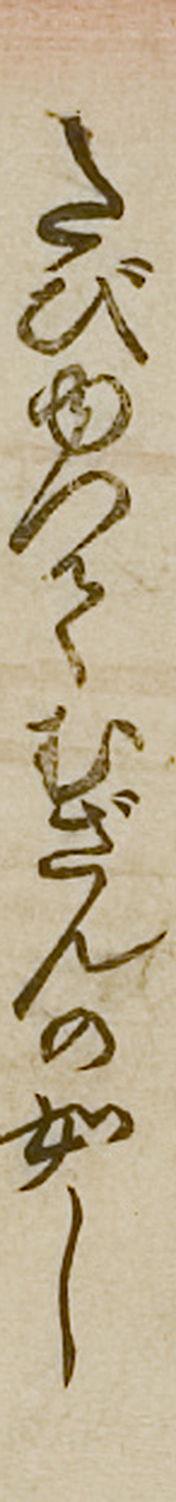たびゆつてむざんの如し
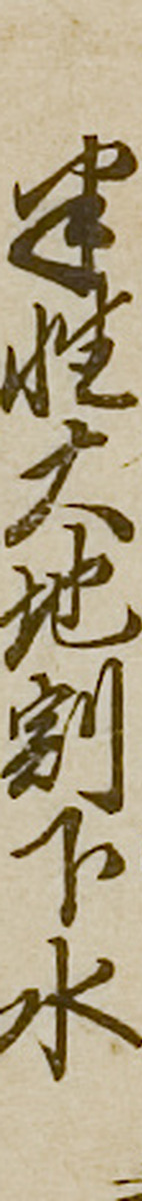半性大地割下水
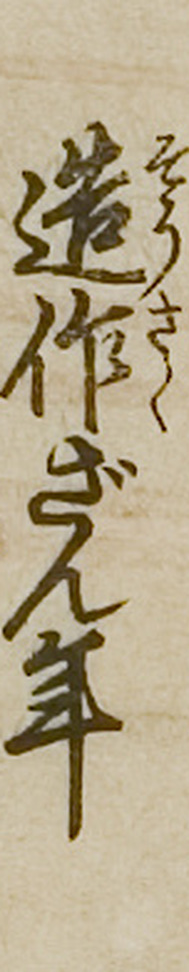造作ざん年
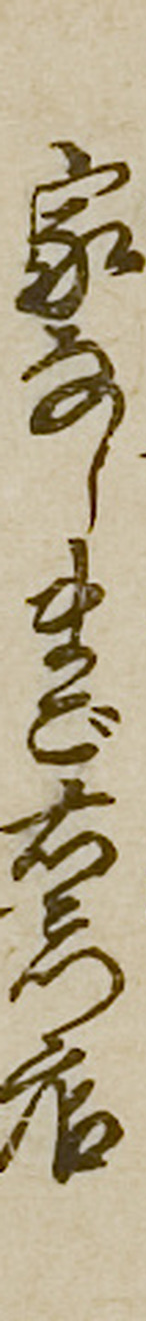家なしまご右衛門店
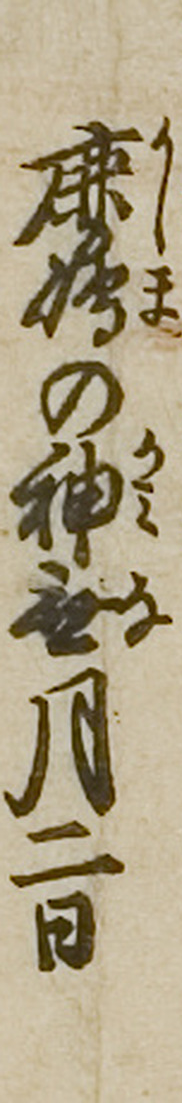鹿嶋の神無月二日
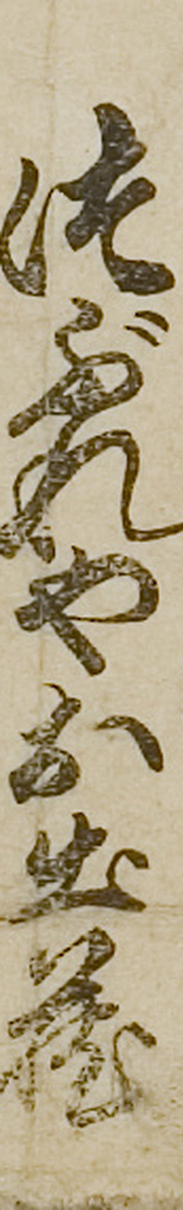つぶれやお土蔵
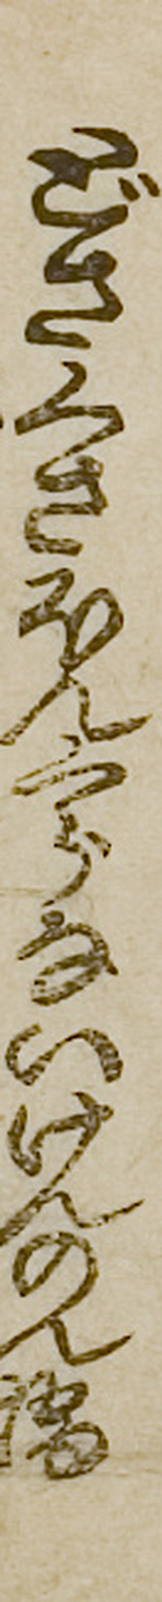どさくさほんくらないけんのん橋
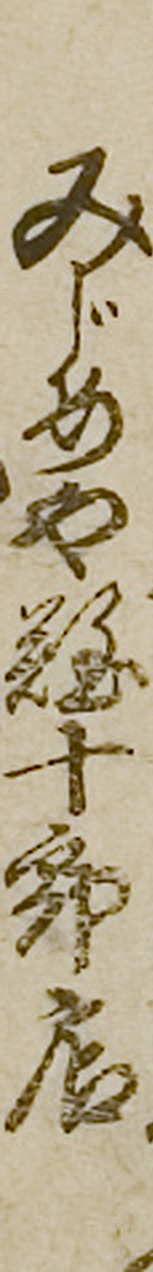みじめや難十郎店
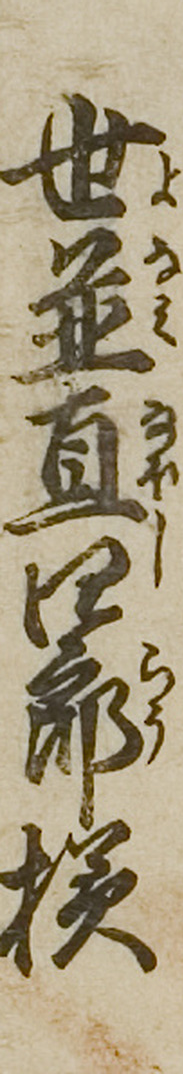世並直四郎様
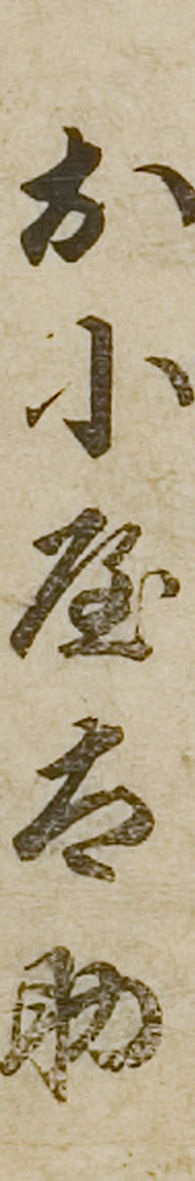お小屋太助
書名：地震方々人逃状之事
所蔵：東京大学総合図書館 General Library in the University of Tokyo, JAPAN
